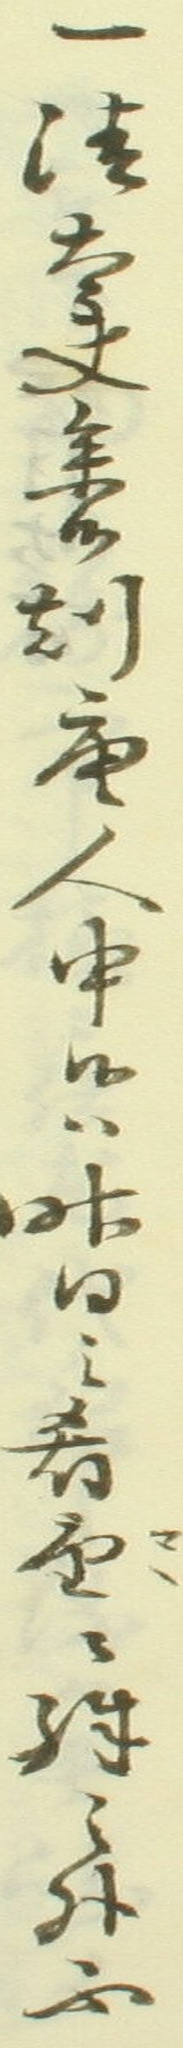一清太夫参候刻唐人申候は昨日之肴望に殊之外不
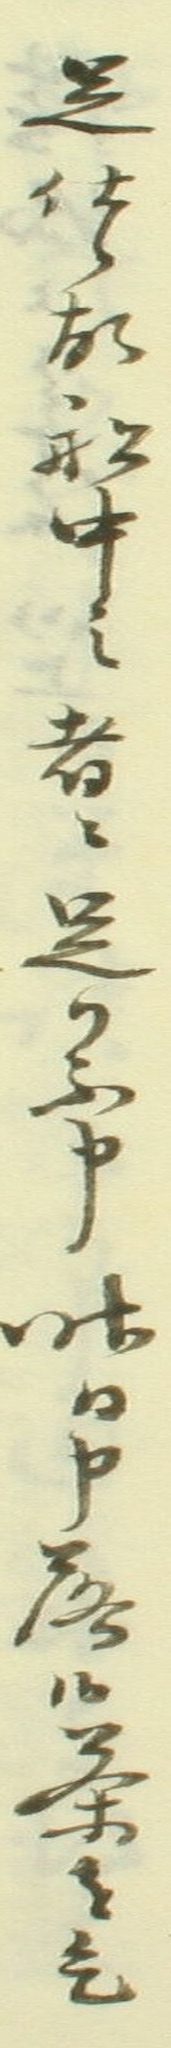足仕候故船中之者に足り不申昨日申落候茶を乞
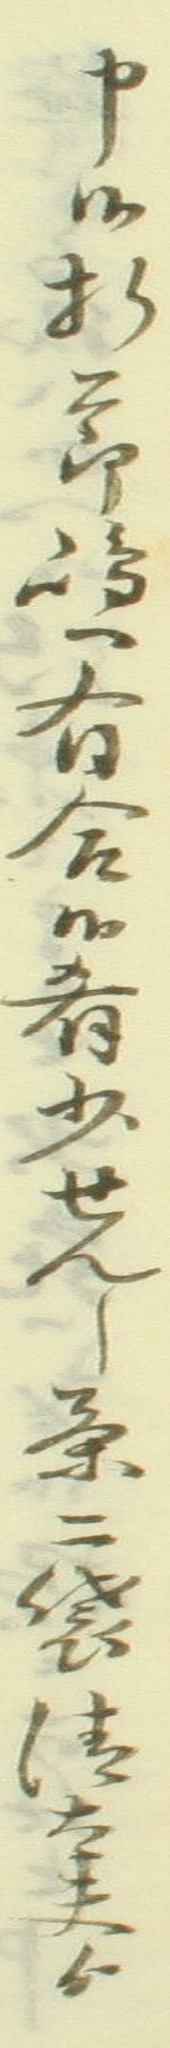申候折節嶋へ有合候肴少せんし茶に二太夫ゟ
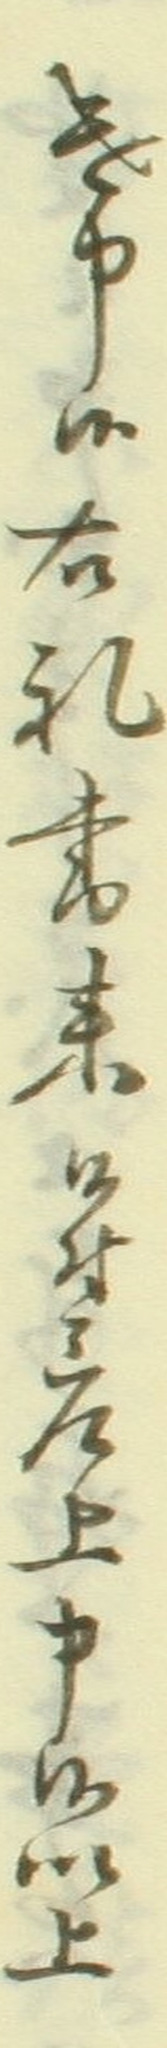遣申候右礼書来候付差上申候以上
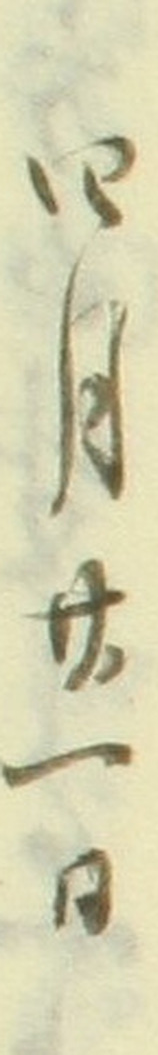四月廿一日
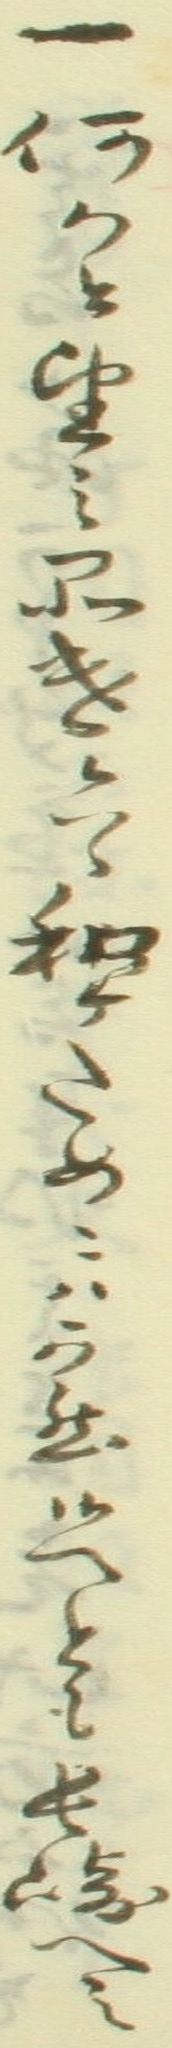一何かと望之品遣候はゝ和ヶためには可然候へとも長崎へ之
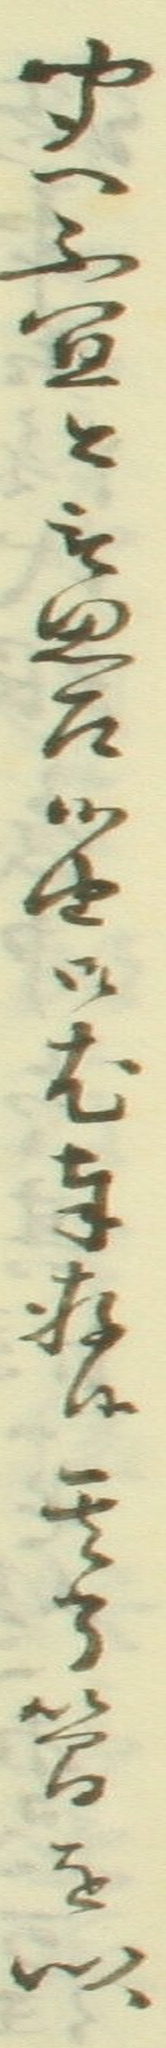聞へ不宜とも思召候由御尤奉存候其了簡を以

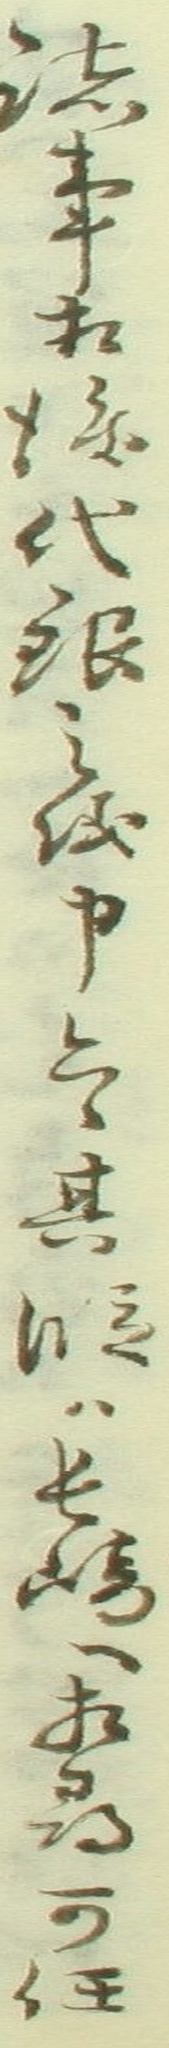諸事相渡代銀之儀申候はゝ其段は長崎へ相尋可任
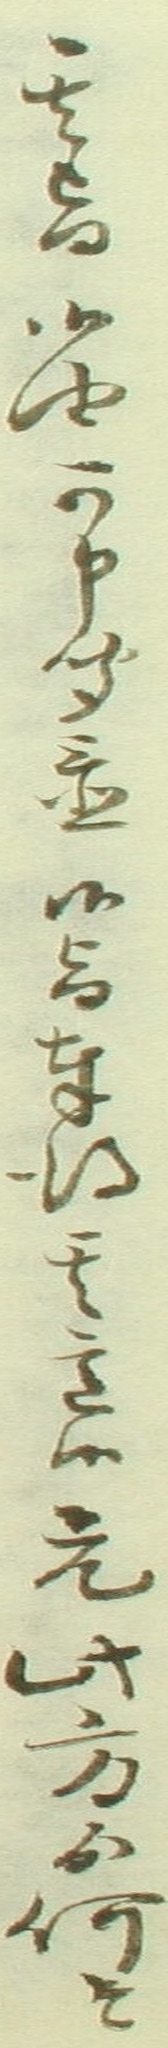其旨候由可申聞置候旨奉得其意候尤此方ゟ何そ
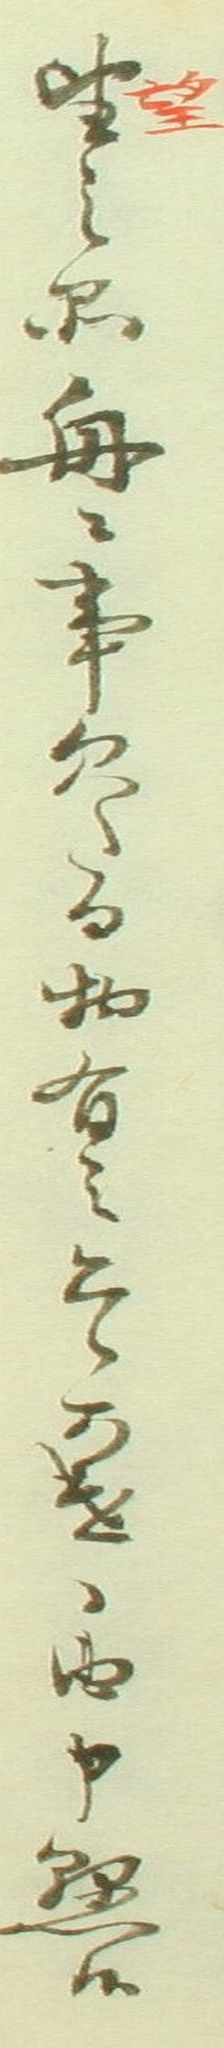望之品舟に事欠たる物有之候はゝ可遣ノ由申懸候
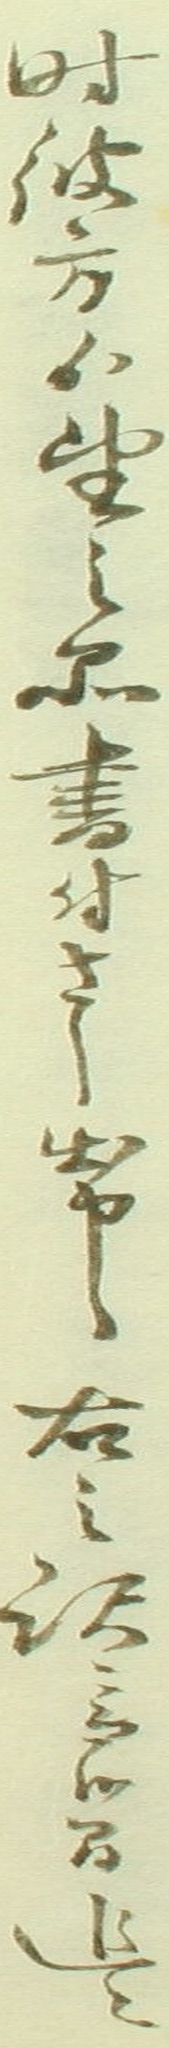時彼方ゟ望之品書付さし出申し候右之訳に而候間追々
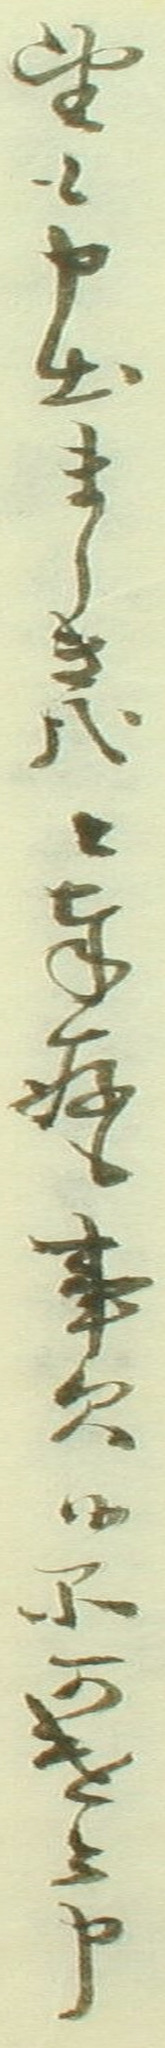望も申出ましき哉と奉存候事欠候品可遣と申
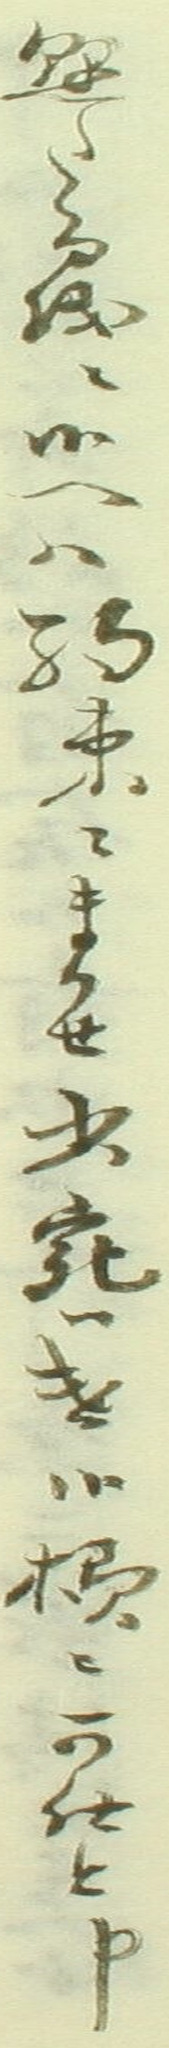懸たる儀に候へは約束にまかせ少宛は遣候様に可仕と申
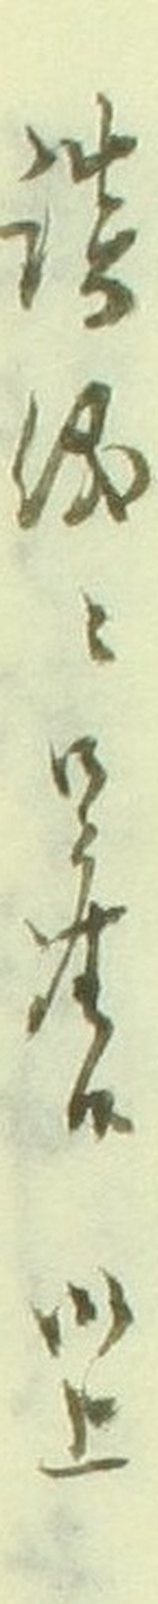談儀に御座候以上
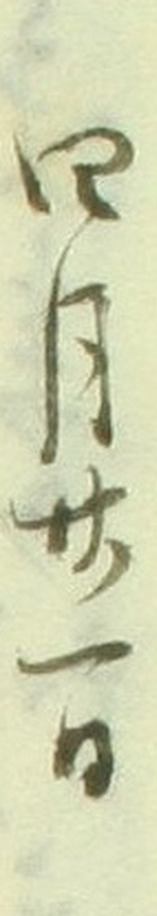四月廿一日
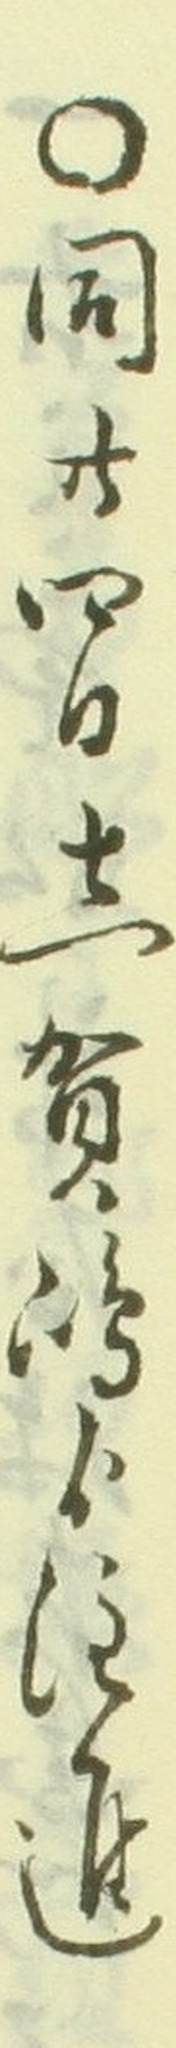〇同廿四日志賀島ゟ注進
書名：異国船漂着記
